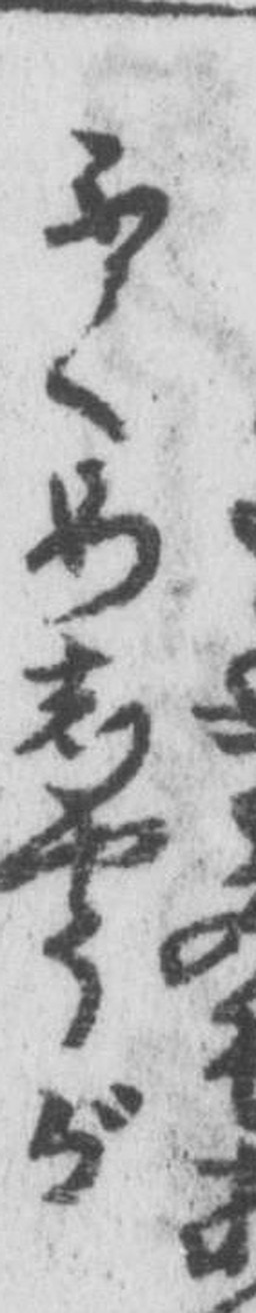ふくめしやうが
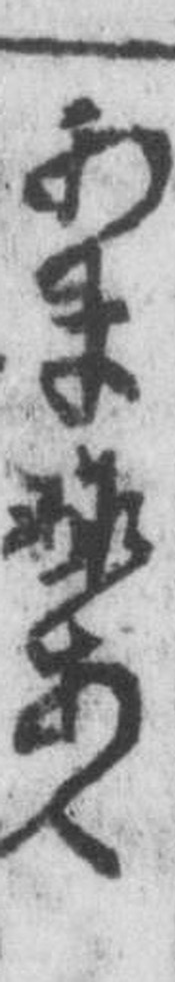あますあへ
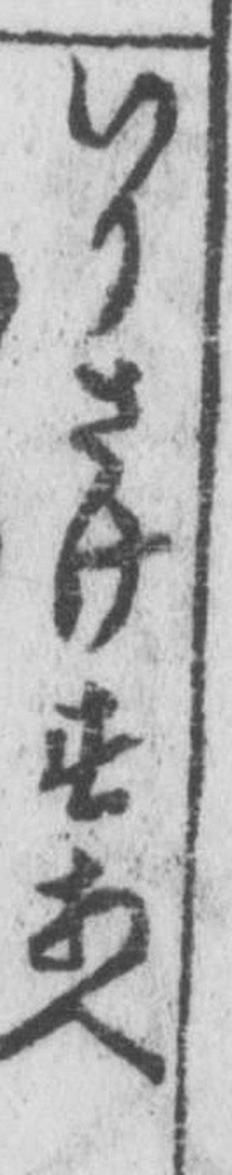いりさけすあへ
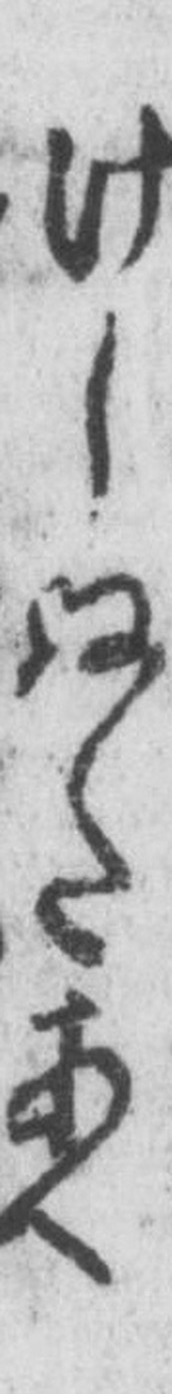きミぬたあへ
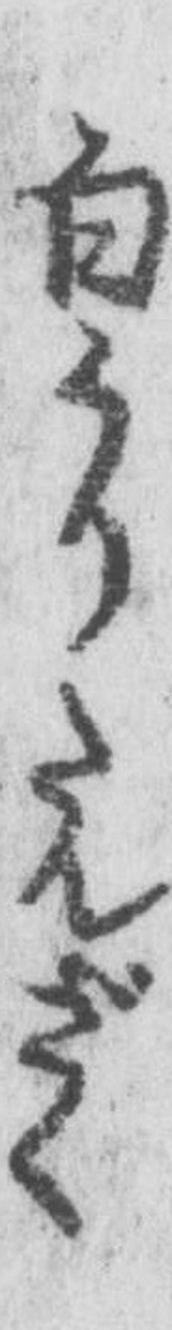白うりたんざく
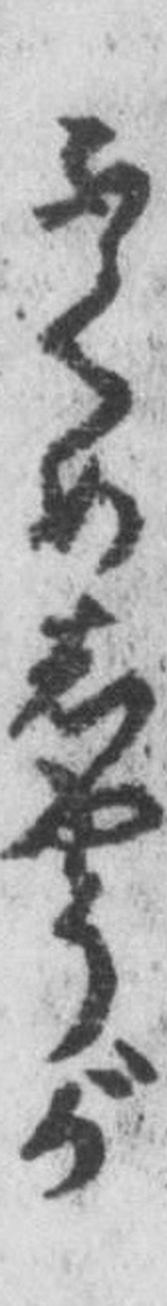ふくめしやうが
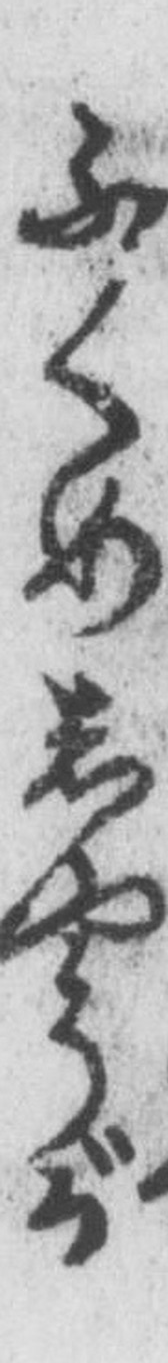ふくめしやうが
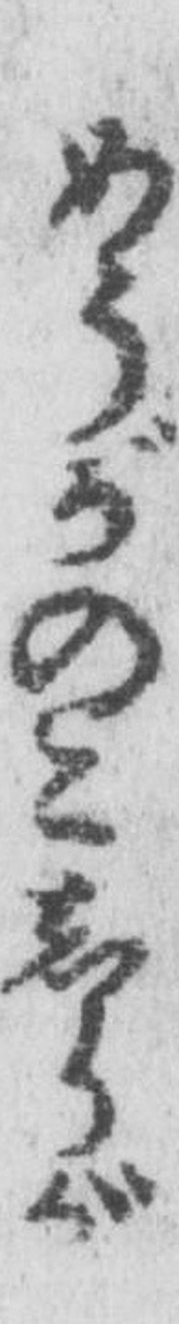めうがのこしらが
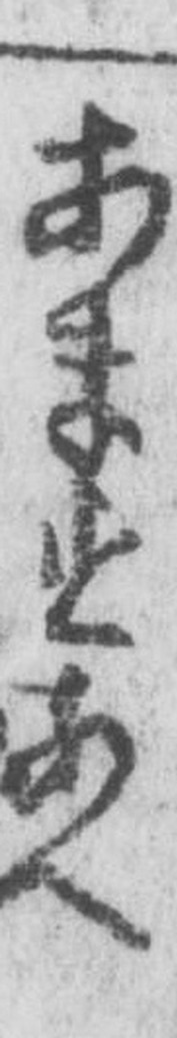あますあへ
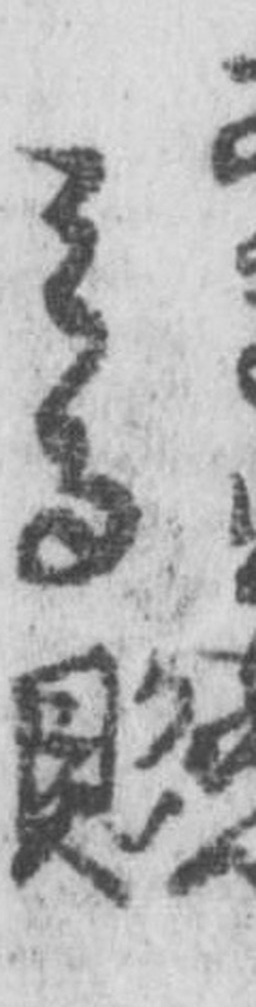ミる貝
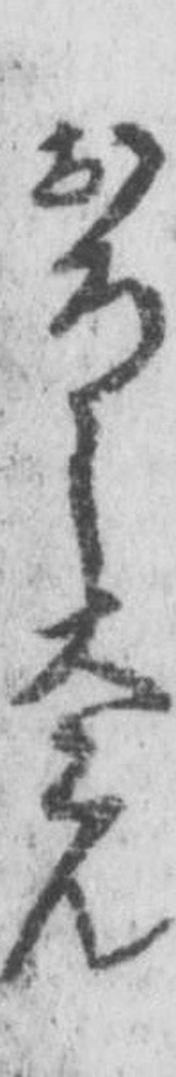おろし大こん
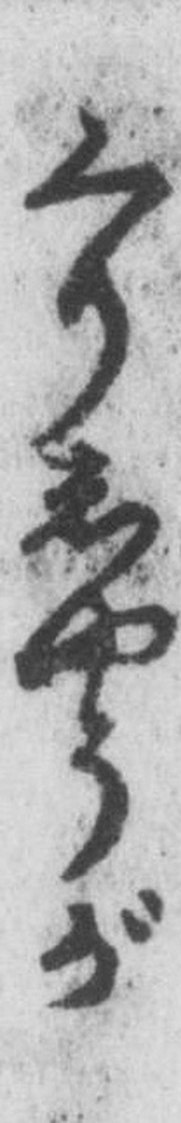ふくめしやうが
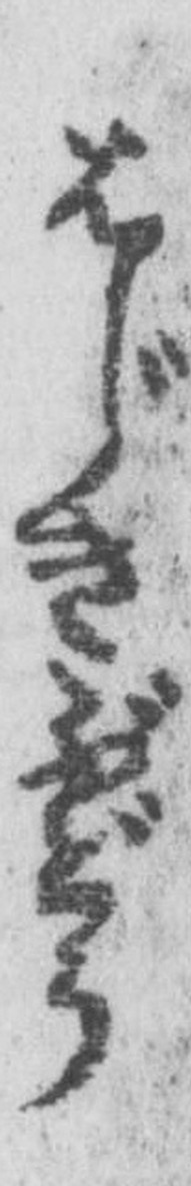はじきぶどう
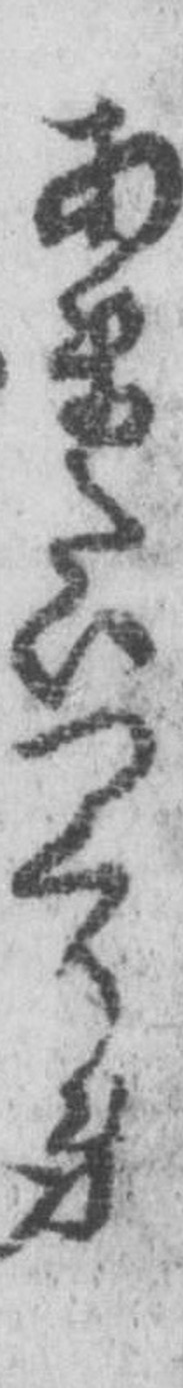あまたいつくり身
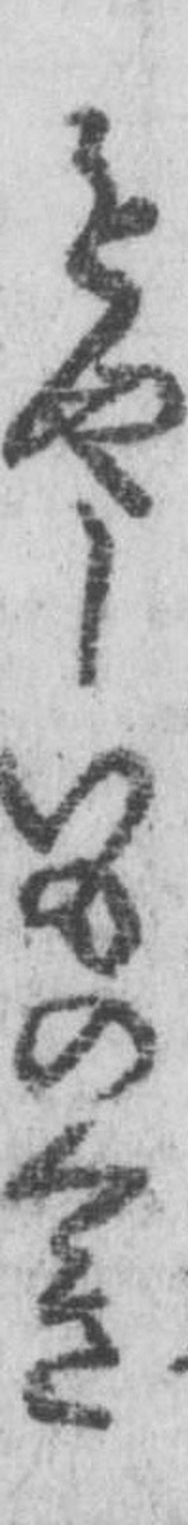もやしいものくき
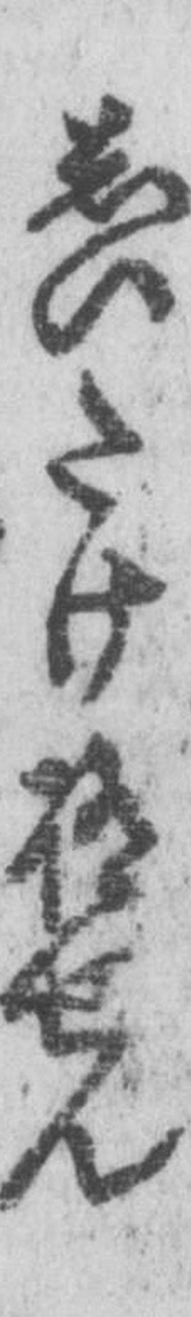しいたけせん
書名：当世料理献立
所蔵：大阪府立大学学術情報センター 国文学研究資料館
